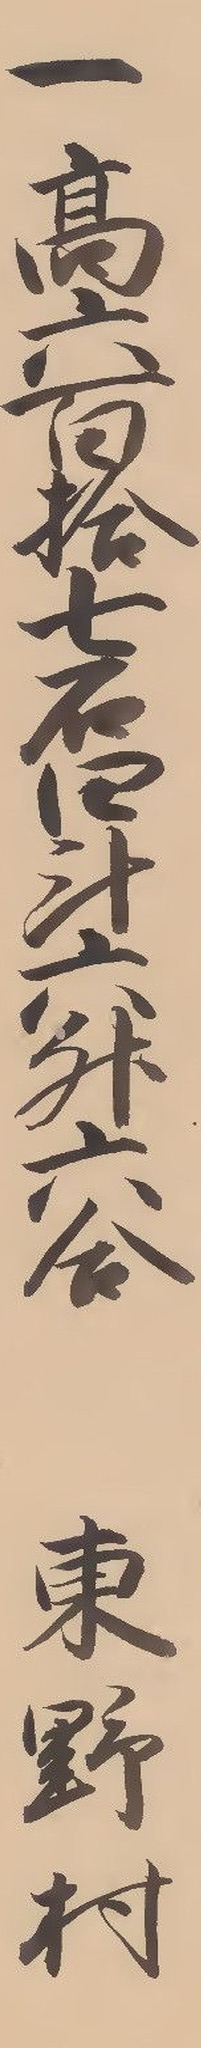一高六百拾七石四斗六升六合東野村

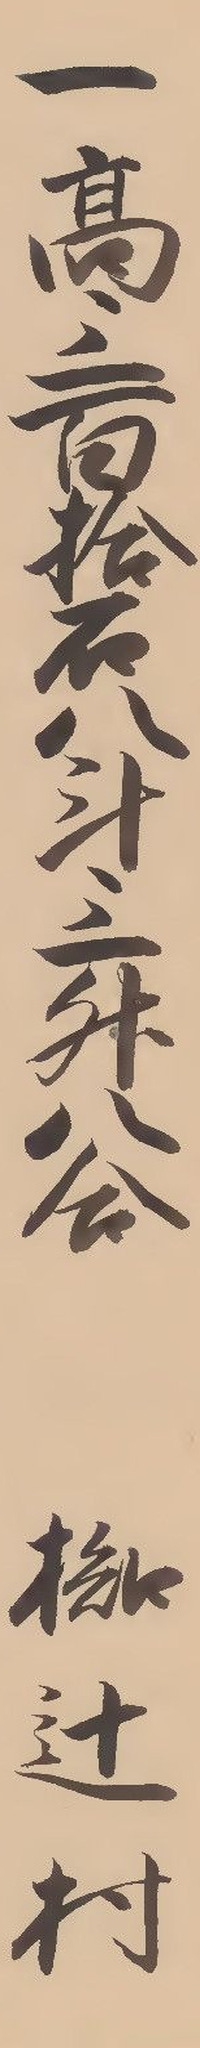一高三百拾石八斗三升八合椥辻村
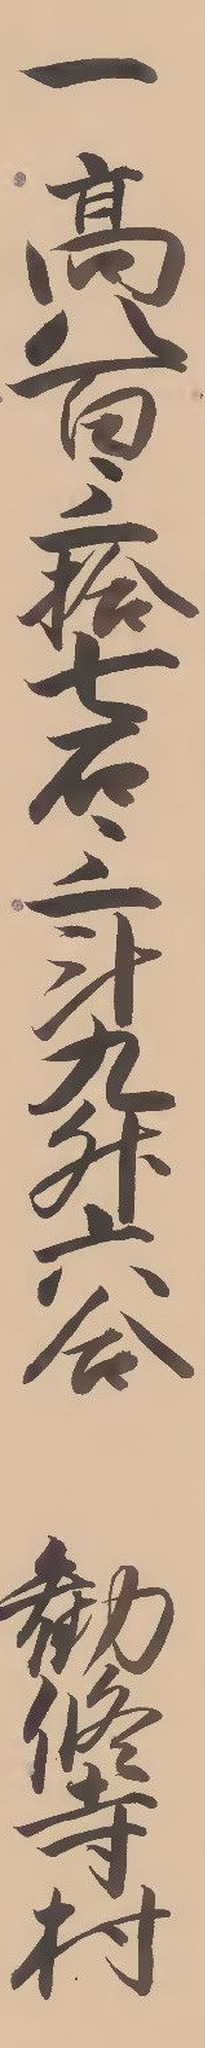一高八百三拾七石三斗九升六合勧修寺村
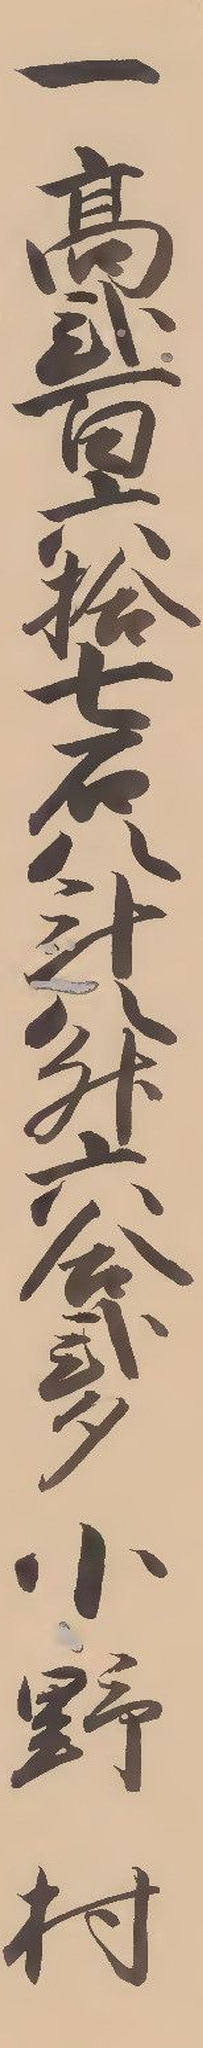一高弐百六拾七石八斗八升六合弐タ小野村
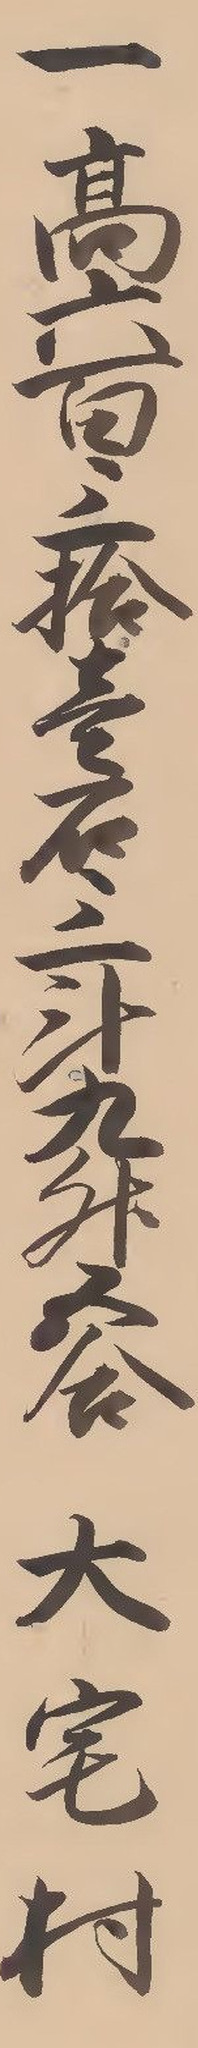一高六百三拾壱石三斗九升五合大宅村
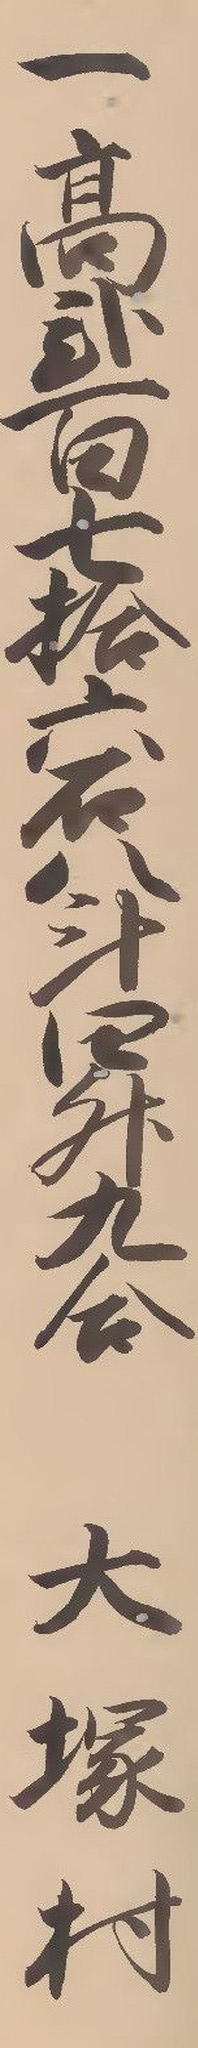一高弐百七拾六石八斗四升九合大塚村
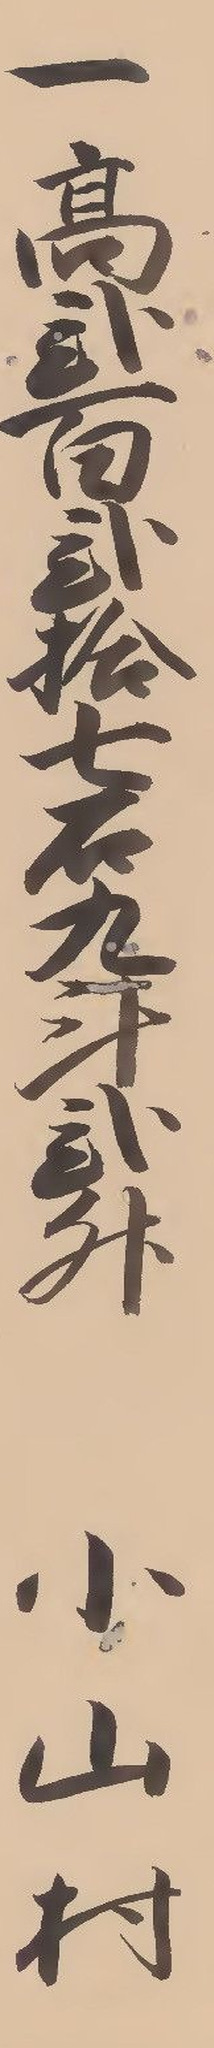一高弐百弐拾七石九斗弐升小山村
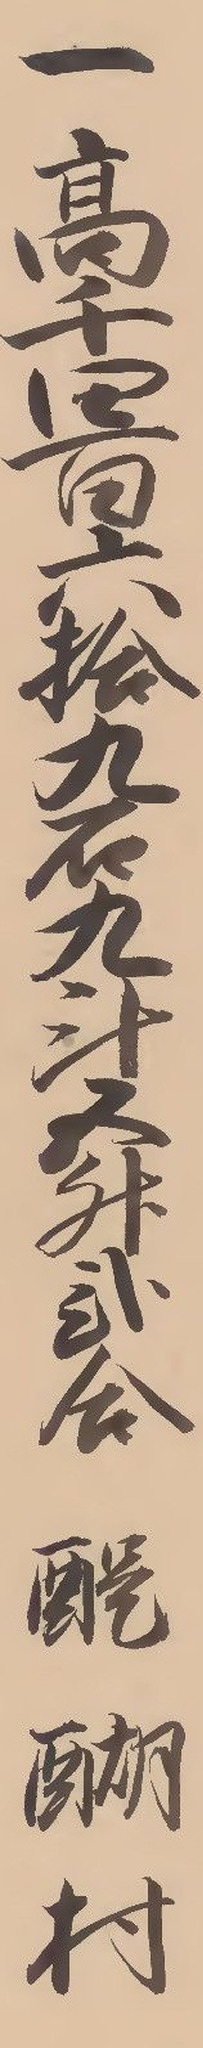一高千四百六拾九石九斗五升弐合醍醐村

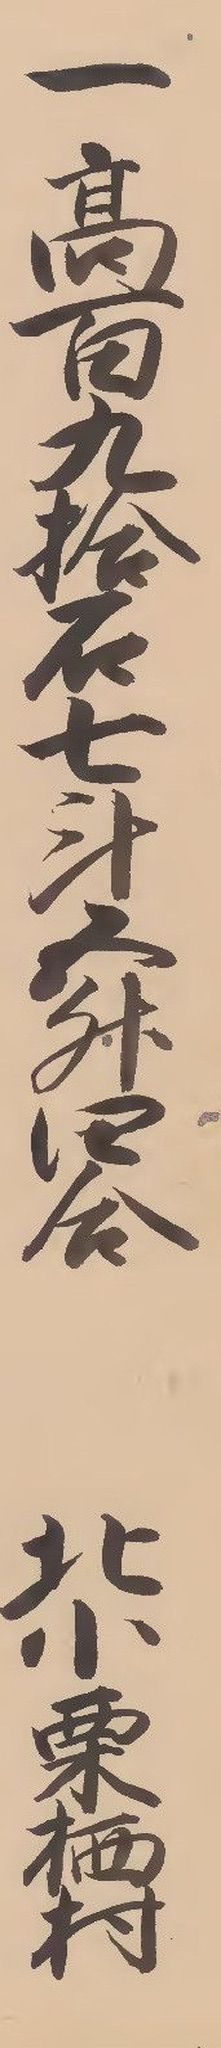一高百九拾石七斗五升四合北小栗栖村
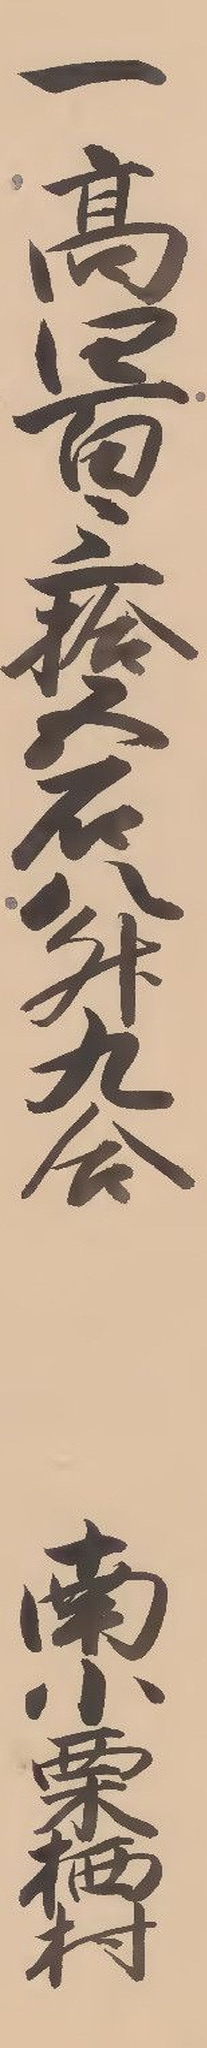一高四百三拾五石八升九合南小栗栖村
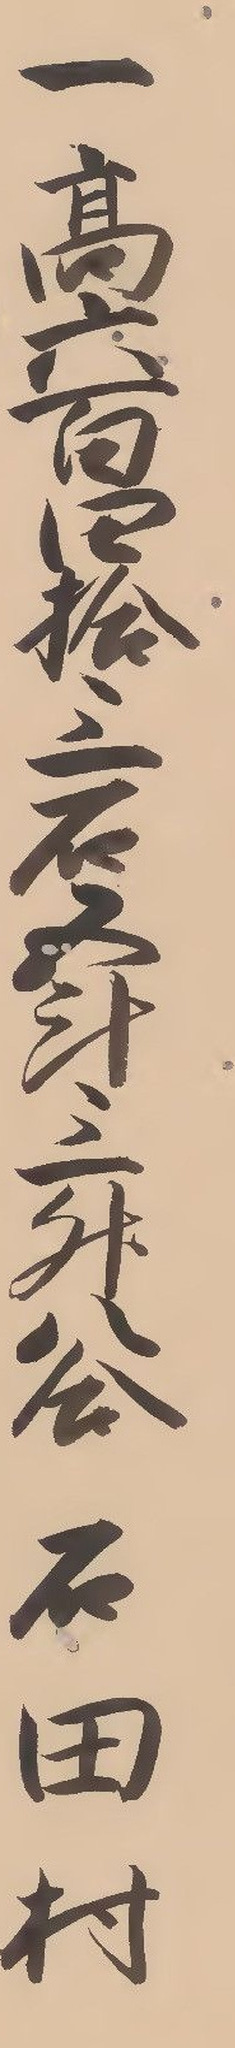一高六百四拾三石五斗三升八合石田村
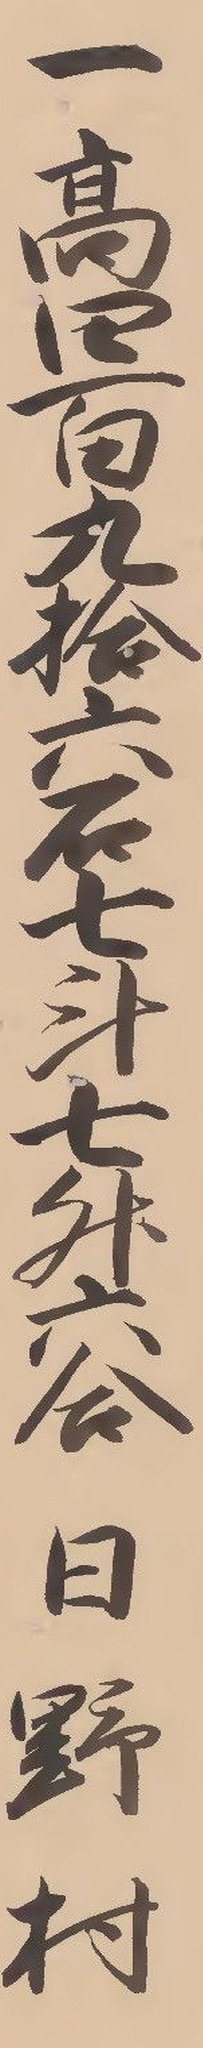一高四百九拾六石七斗七升六合日野村
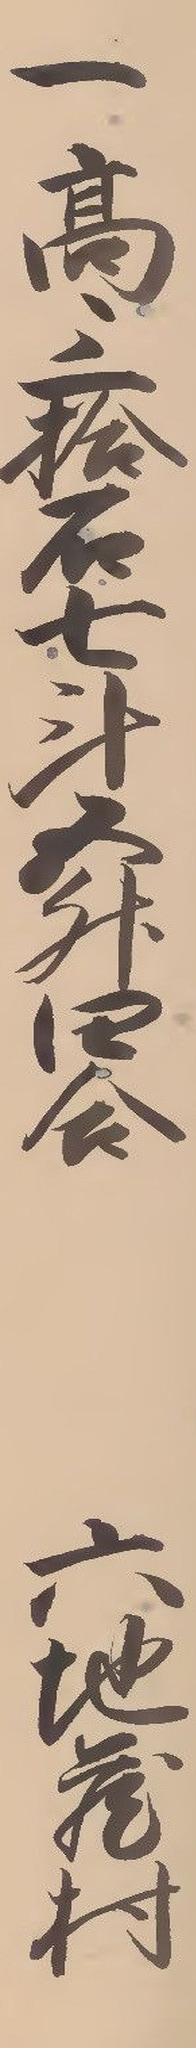一高三拾石七斗五升四合六地蔵村
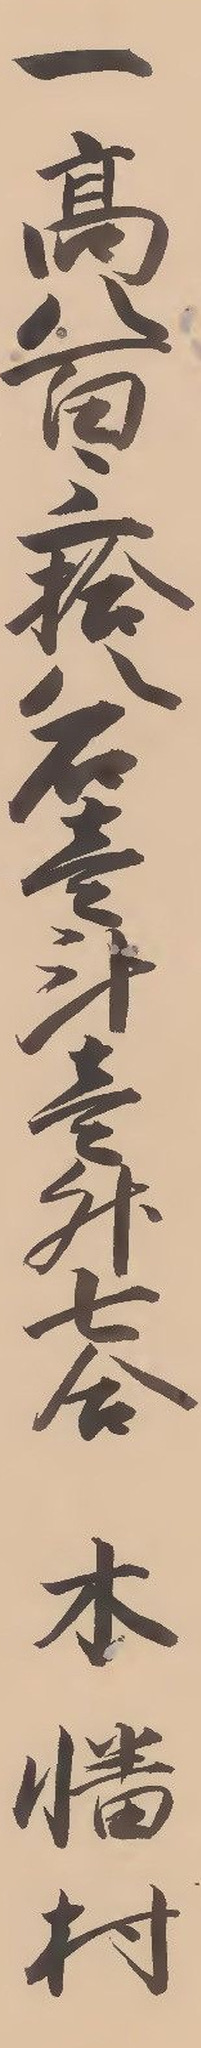一高八百三拾八石壱斗壱升七合木幡村
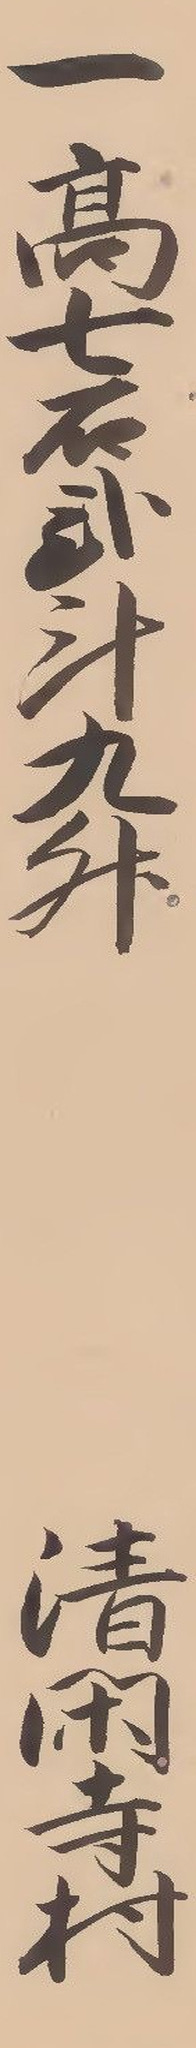一高七石弐斗九升清閑寺村

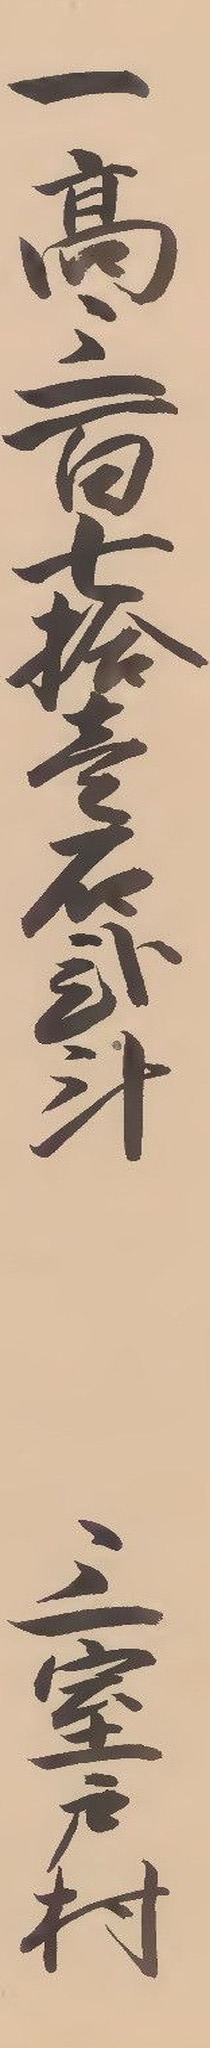一高三百七拾壱石弐斗三室戸村
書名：山城国郷帳
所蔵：国立公文書館 National Archives of Japan
